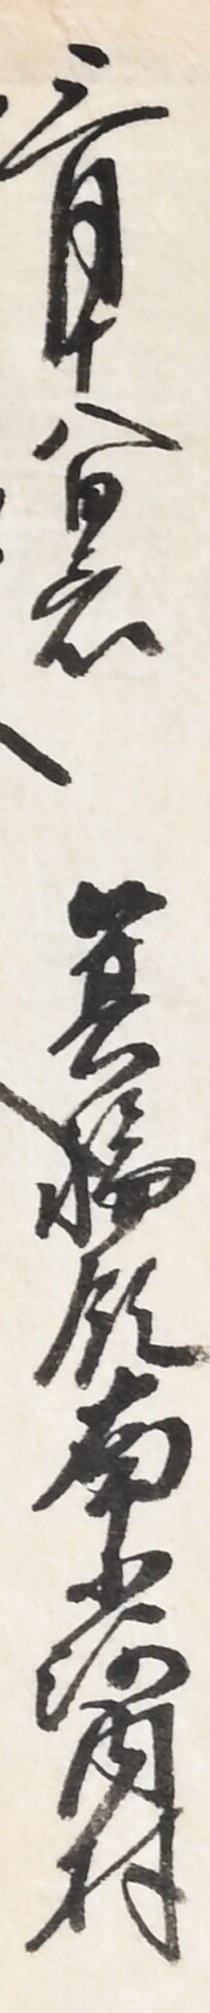三月十八日着箕輪領南小河内村
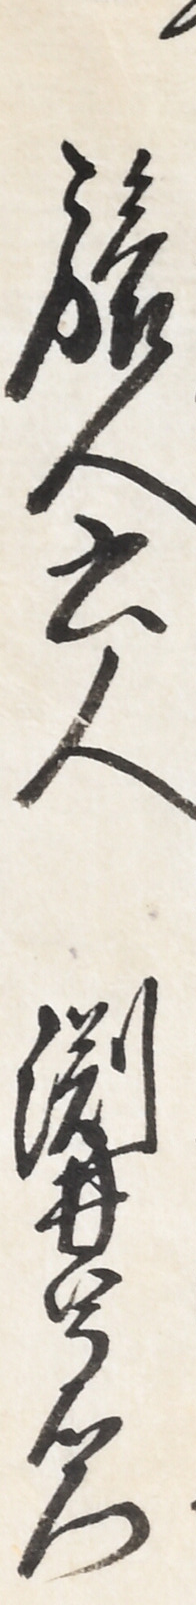一旅人六人淵井宇右衛門
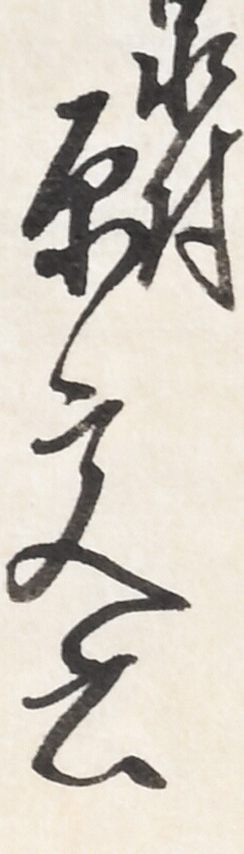原文六
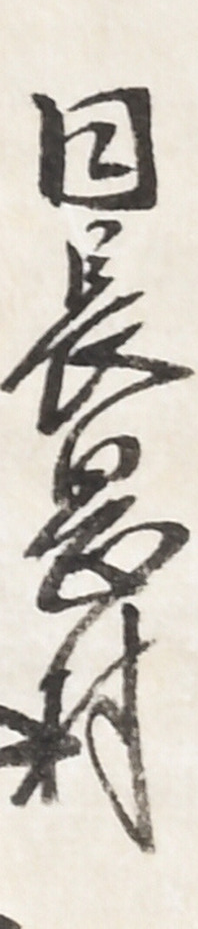同長岡村
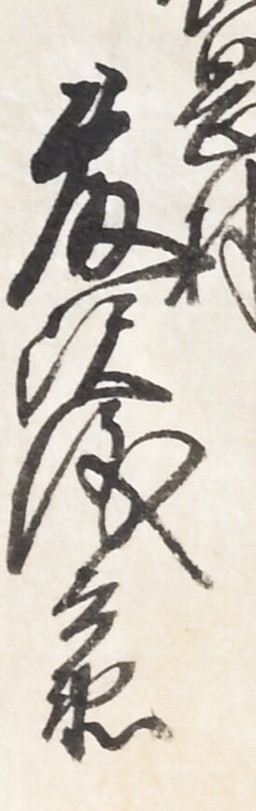藤沢儀兵衛
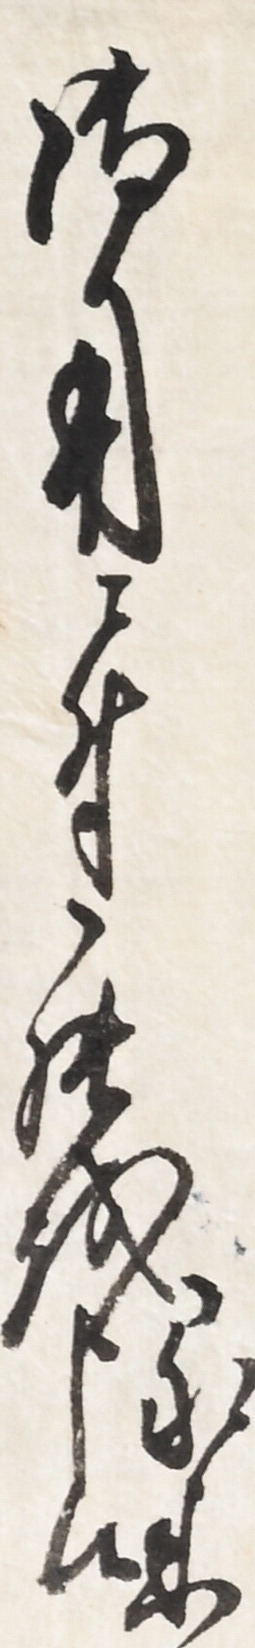御用ニ付罷越申候
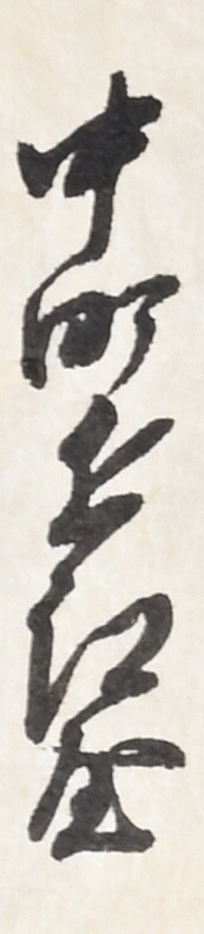中町近江屋
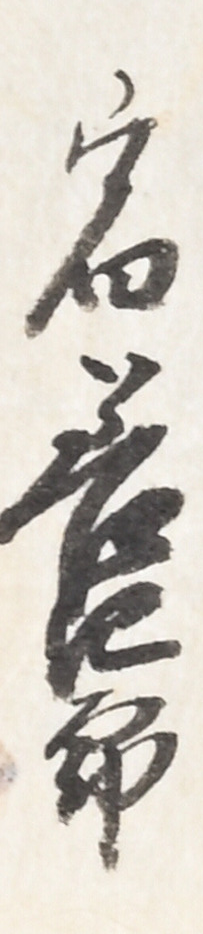宿善四郎
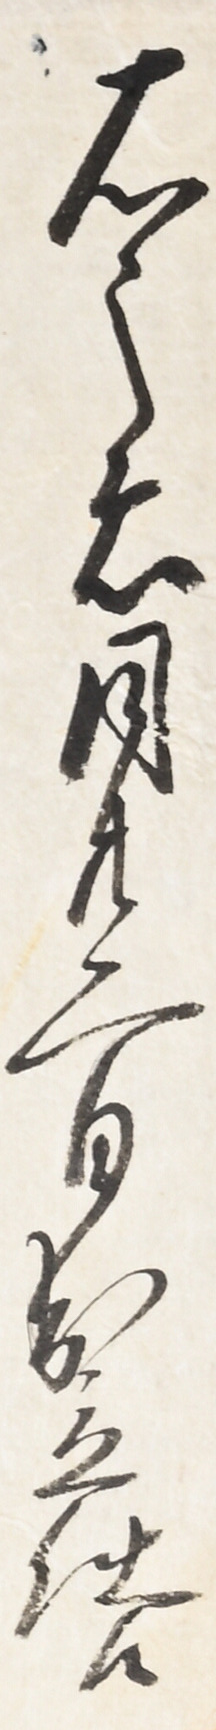右之者同廿二日出立仕候
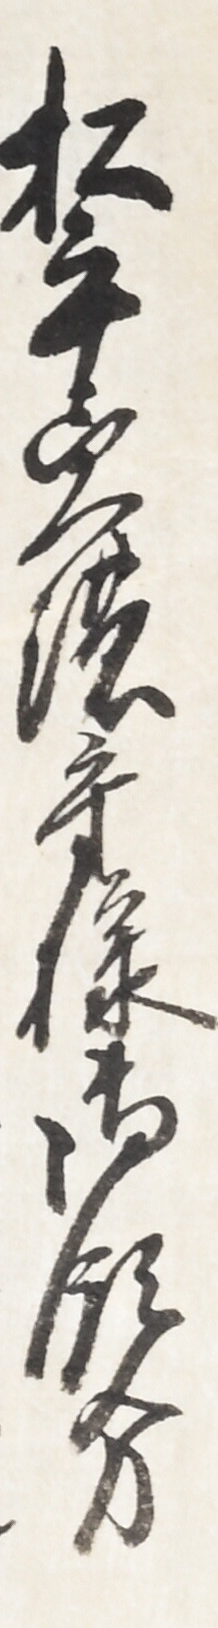松平美濃守様御領分
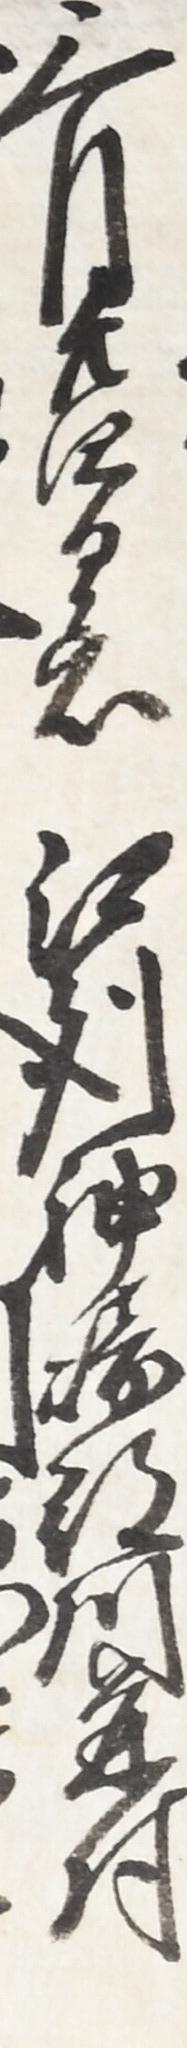三月廿四日着江州神崎郡川並村
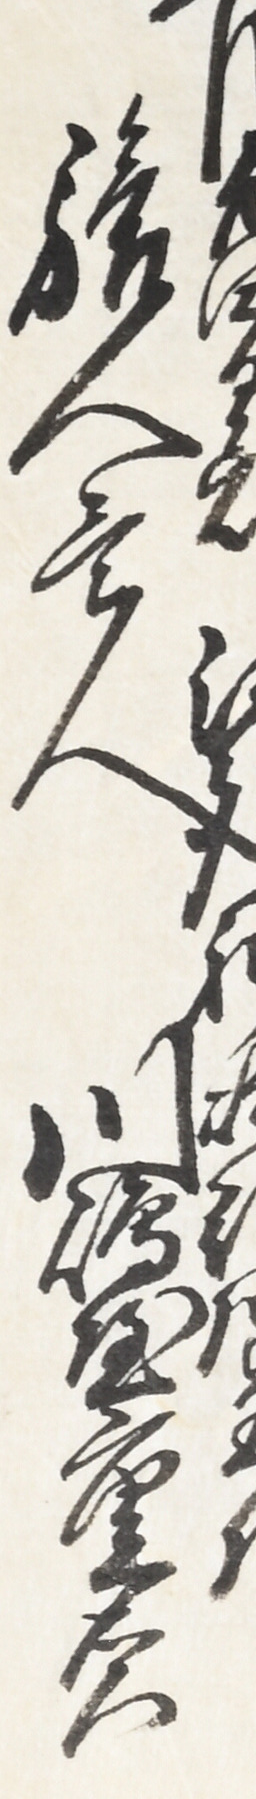一旅人壱人川嶋屋重右衛門
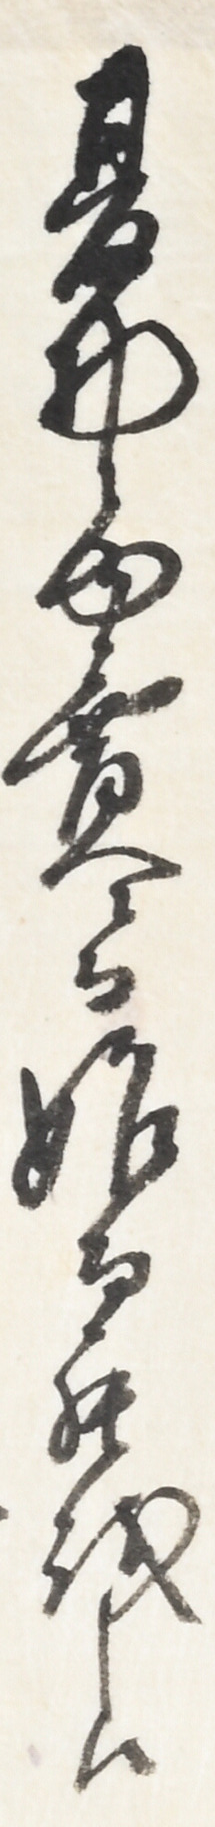夏物商売ニ而始而罷越申候
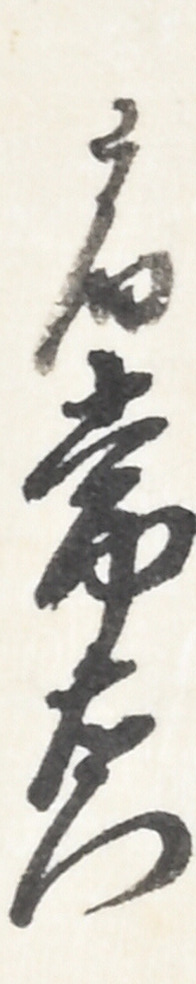宿常右衛門
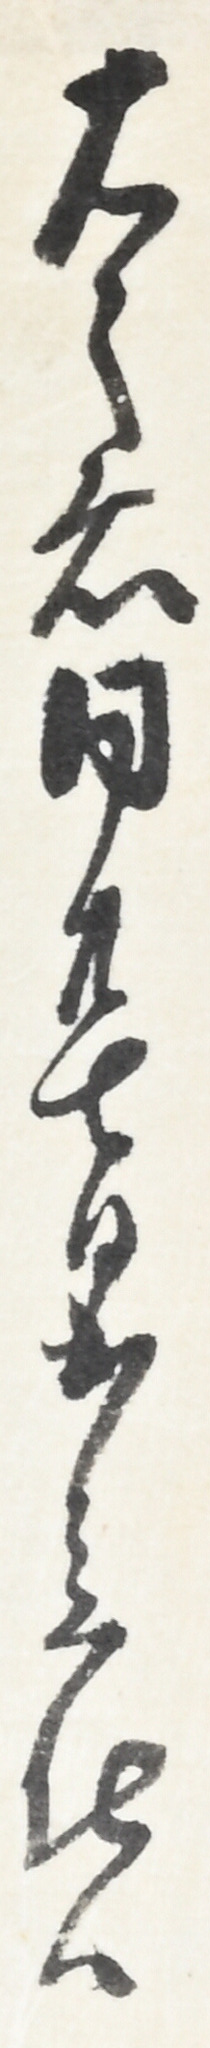右之者同廿七日出立仕候
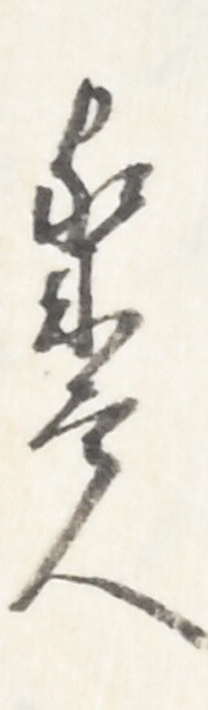家来三人
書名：旅人泊控帳
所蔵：伊那市立高遠町図書館・合同会社AMANE
